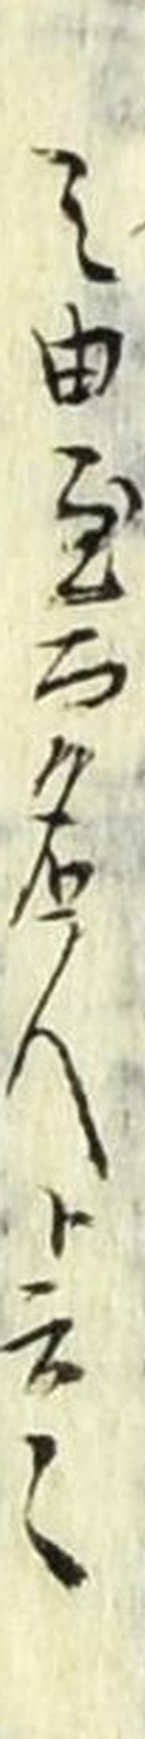之由至而名人ト云々
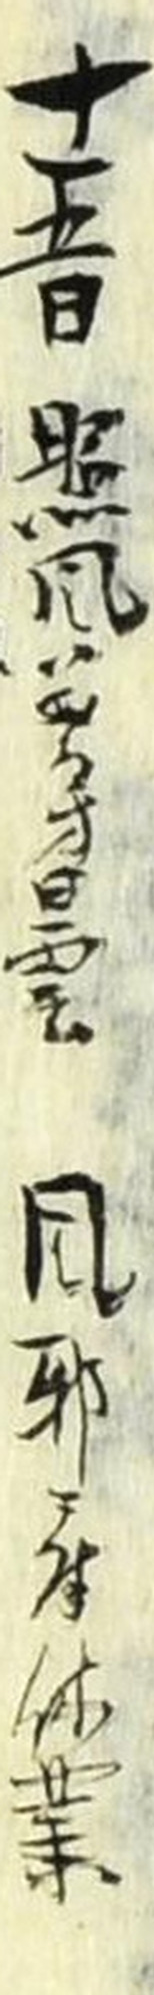十五日照風暮方曇風邪に付休業
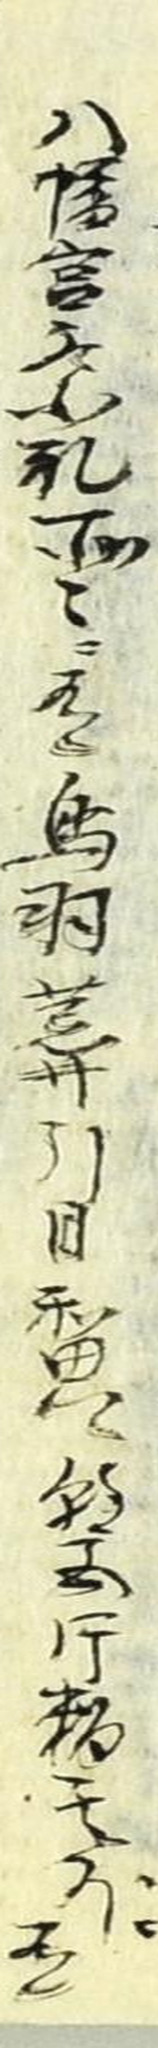八幡宮祭礼所々ニ有鳥羽荒井引目和田郷朝宮片粕其外ニ有
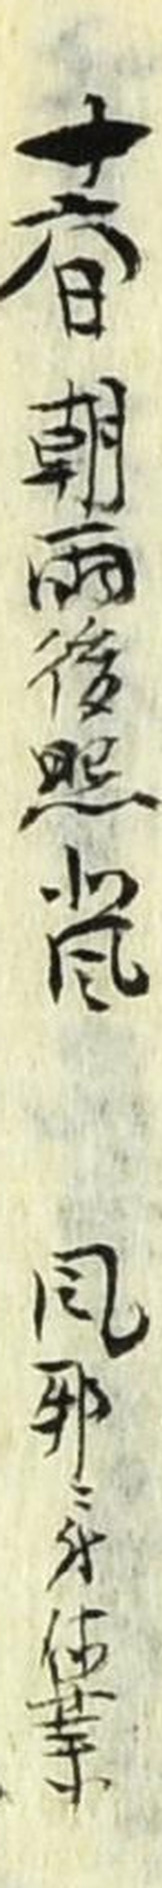十六日朝雨後照北風風邪ニ付休業
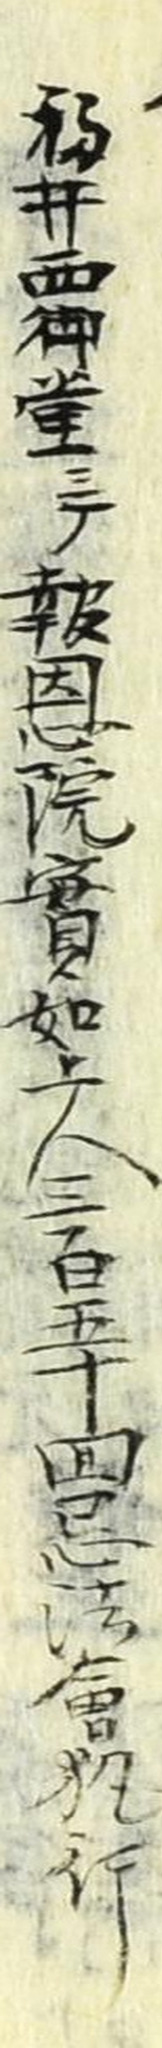福井西御堂ニテ報恩院実如上人三百五十回忌法会執行
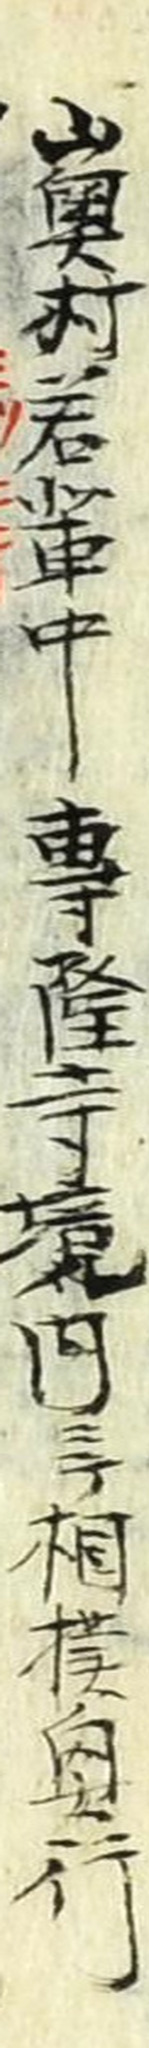山奥村若輩中専隆寺ニテ相撲興行
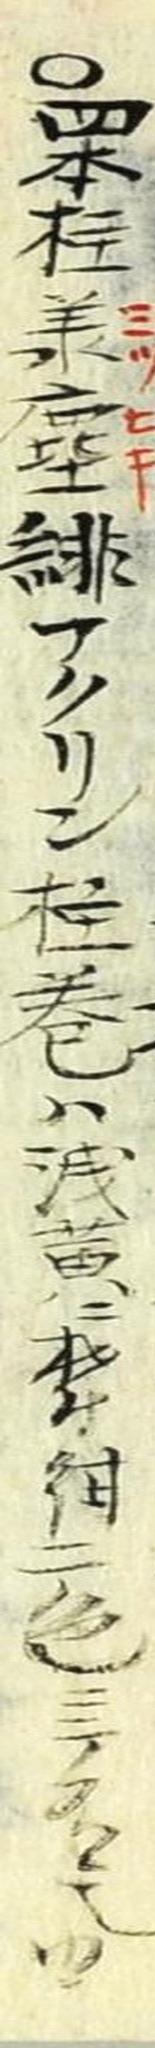○四本柱承塵緋アクリン柱巻ハ浅黄ニ鬱紺二色ニテ有之由
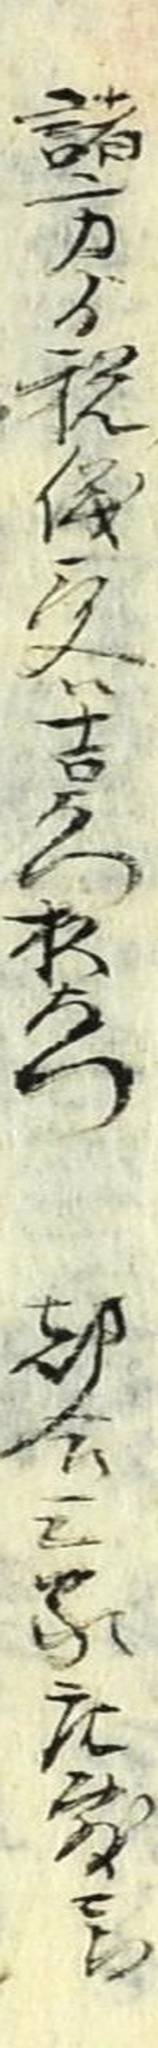諸方ゟ祝儀受ハ吉右衛門杉右衛門都合三家屋敷ニ而
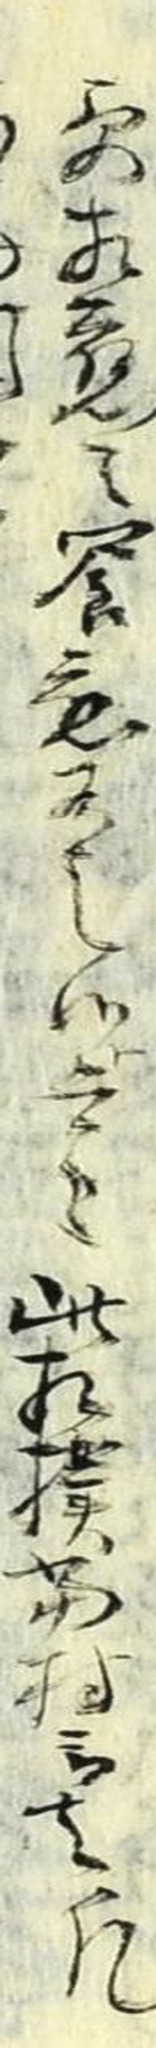受相応之饗応有之候云々此相撲当村ニ而者凡
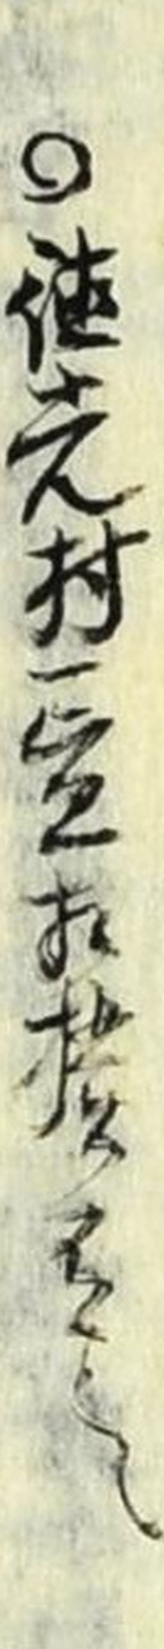○徳光村昼相撲有之
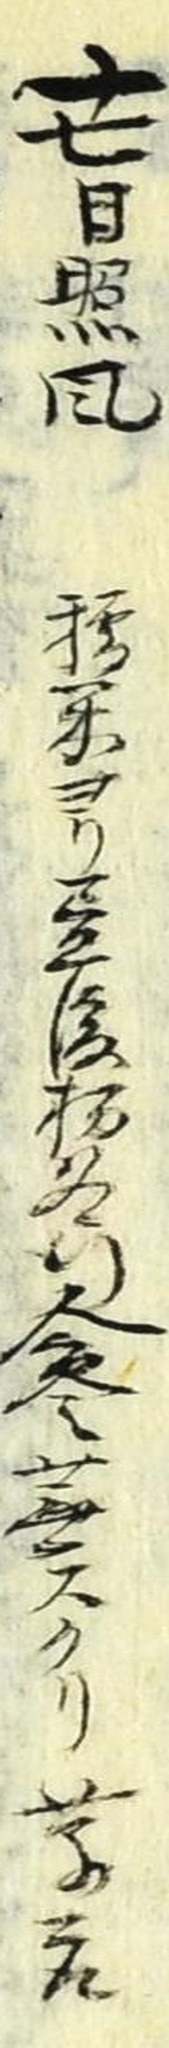十七日照風積米ヨリ昼後柿谷行人参蕪スクリ草取
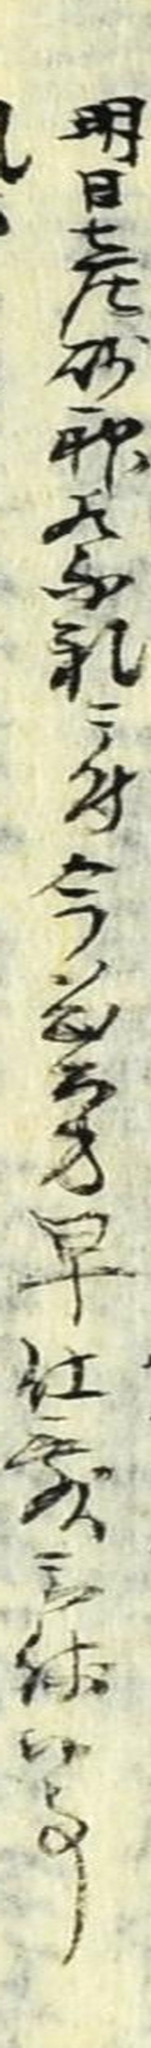明日産砂神祭礼ニ付今暮方早仕舞ニ而休候事
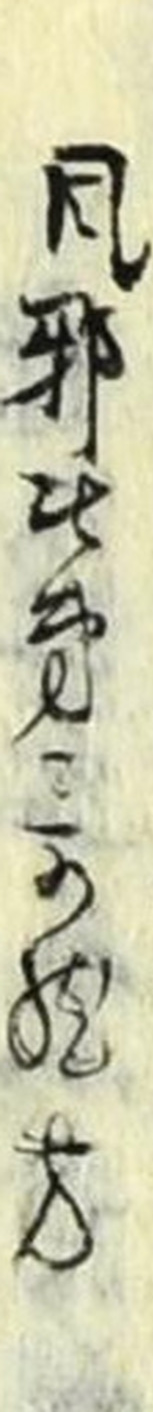風邪次第ニ可然方
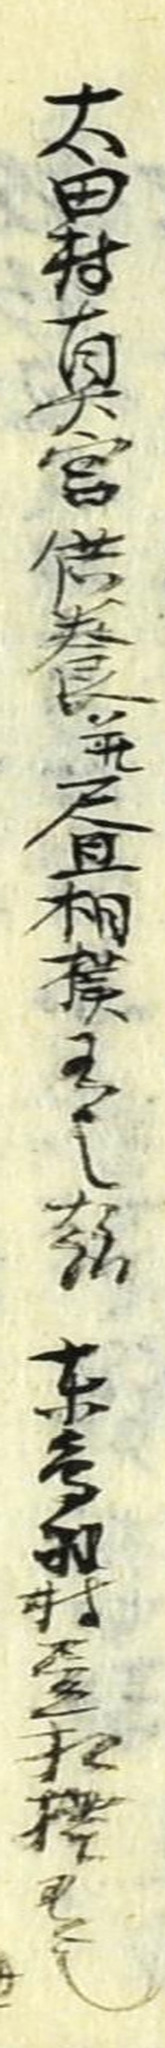太田村真宮供養幷昼相撲有之趣東鳥羽村昼相撲有之由
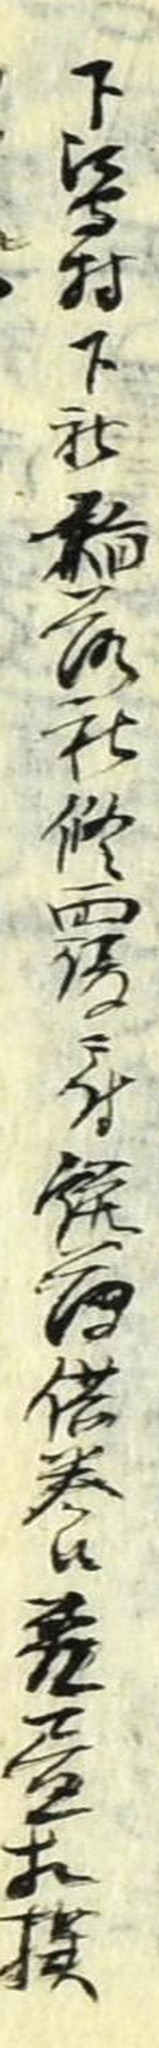下江守村下社稲荷社修復ニ付餅蒔供養差昼相撲
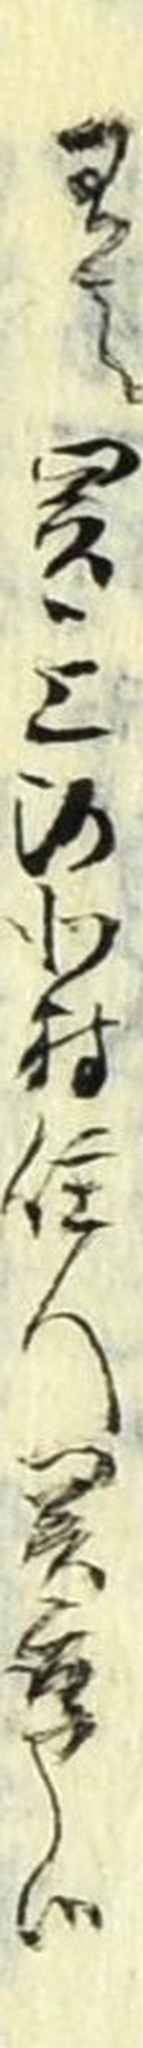有之関ハ上河北村住人関取申候
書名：（日記）
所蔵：福井県文書館 Fukui Prefectural Archives
